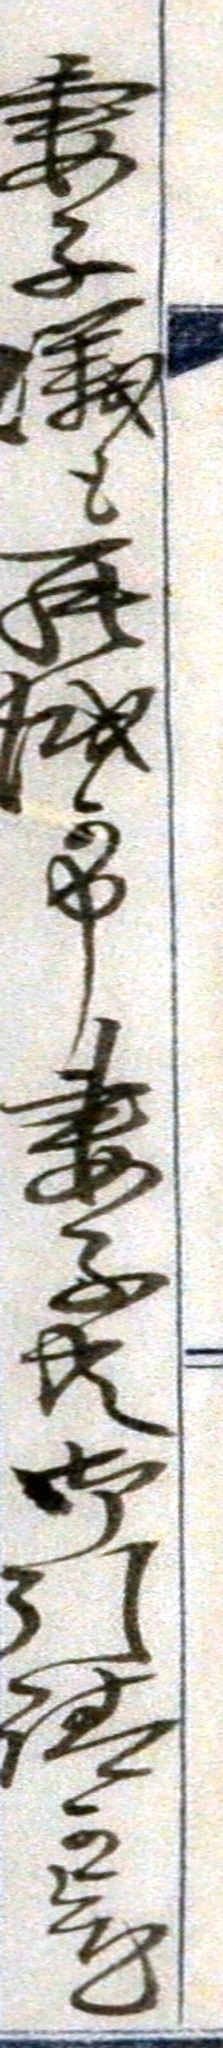妻子儀も罷越可申妻子共御引請可被
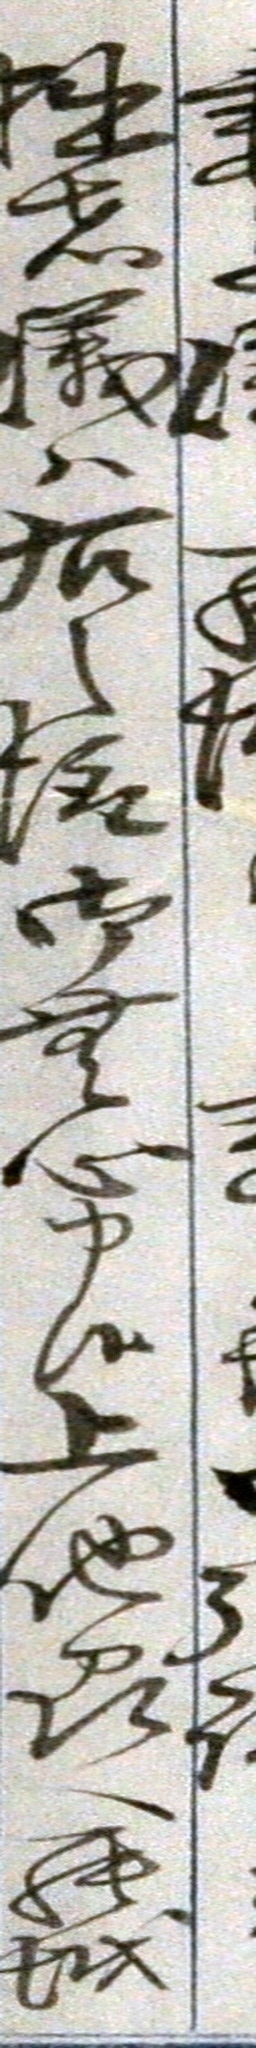拙者儀ハ右之趣御無心申候上他州へ罷越
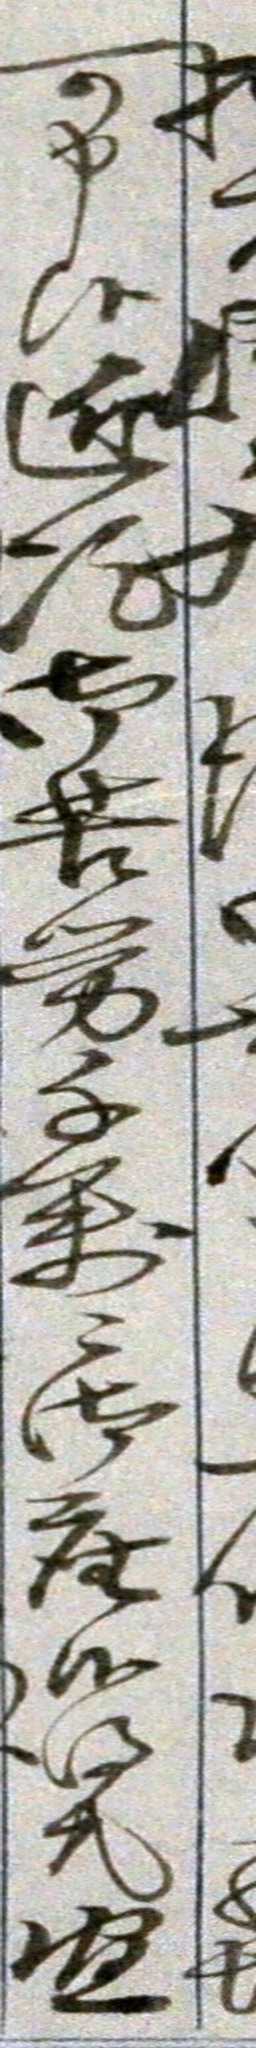可申候近頃御苦労千万ニ御座候得共宜
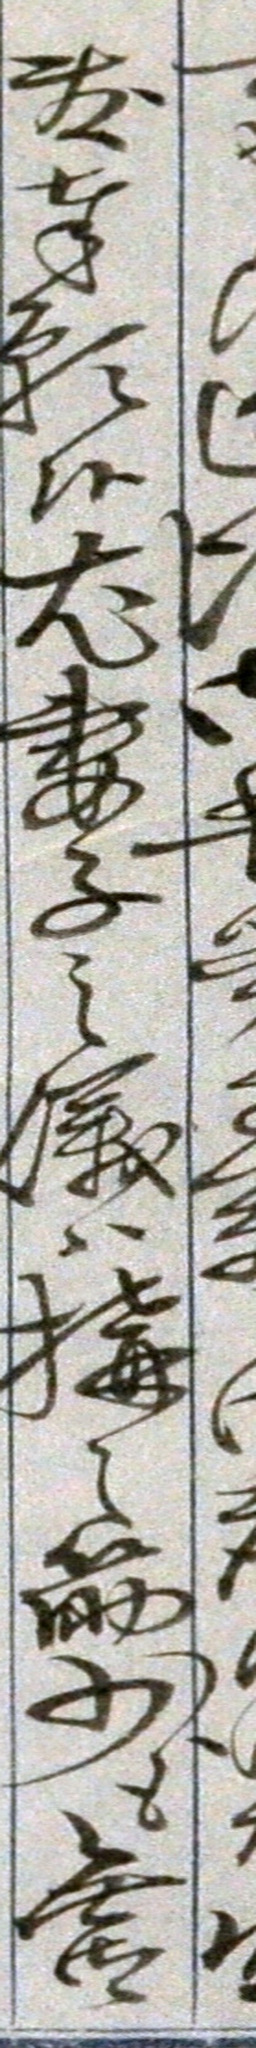敷奉願候尤妻子之儀ハ構之筋少も無御
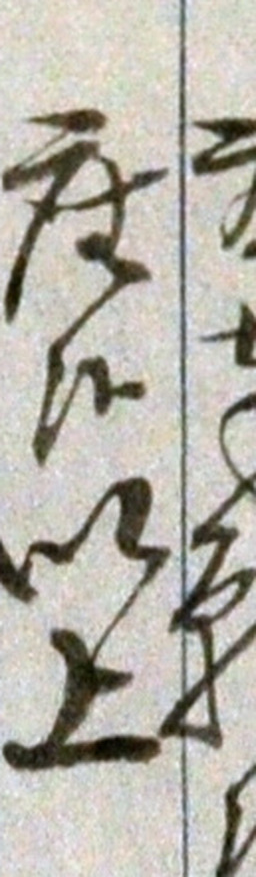座候以上
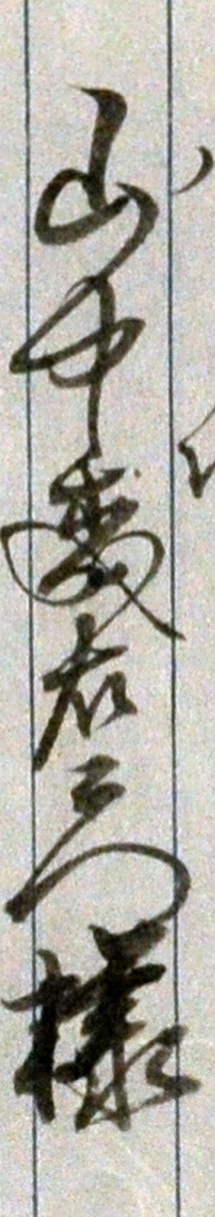山中森右衛門様
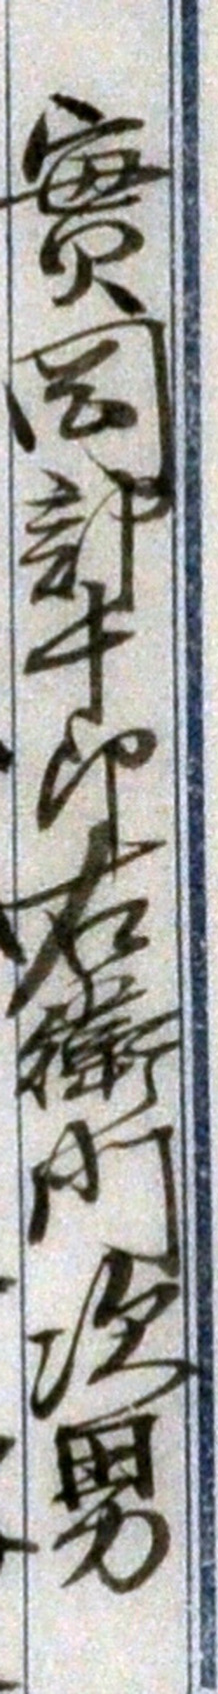実岡部十郎右衛門次男
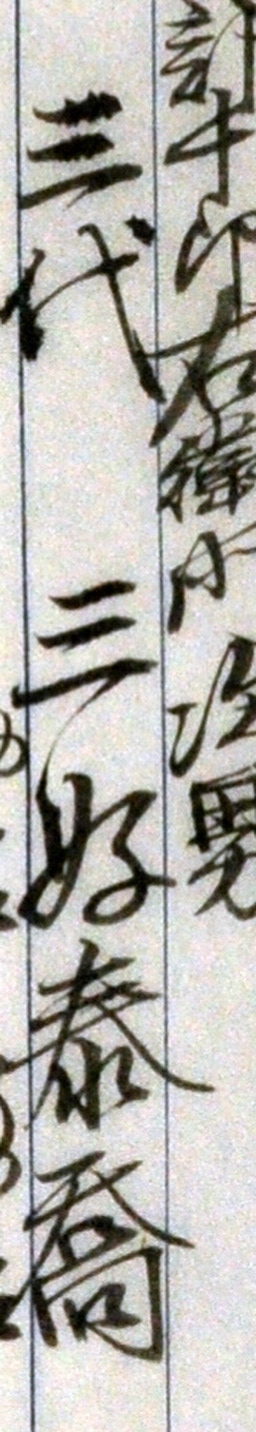三代三好泰喬
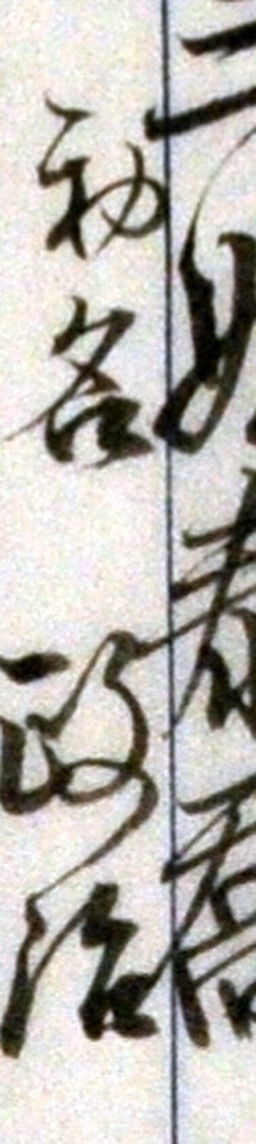初名政治
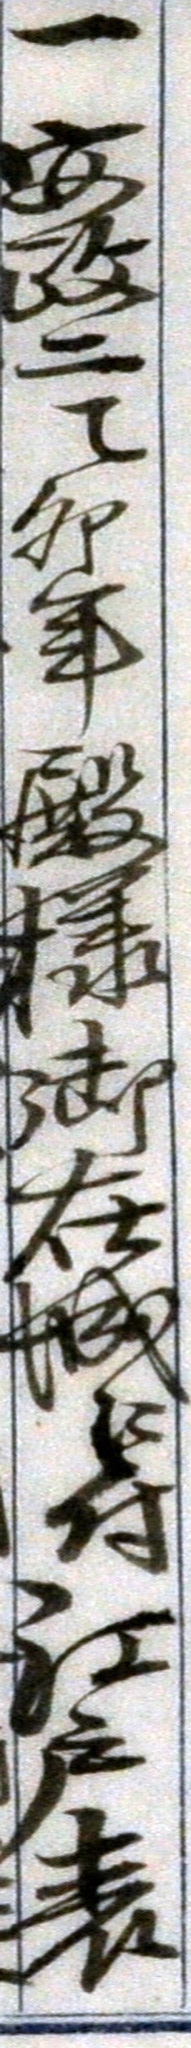一安政二乙卯年殿様御在城に付江戸表
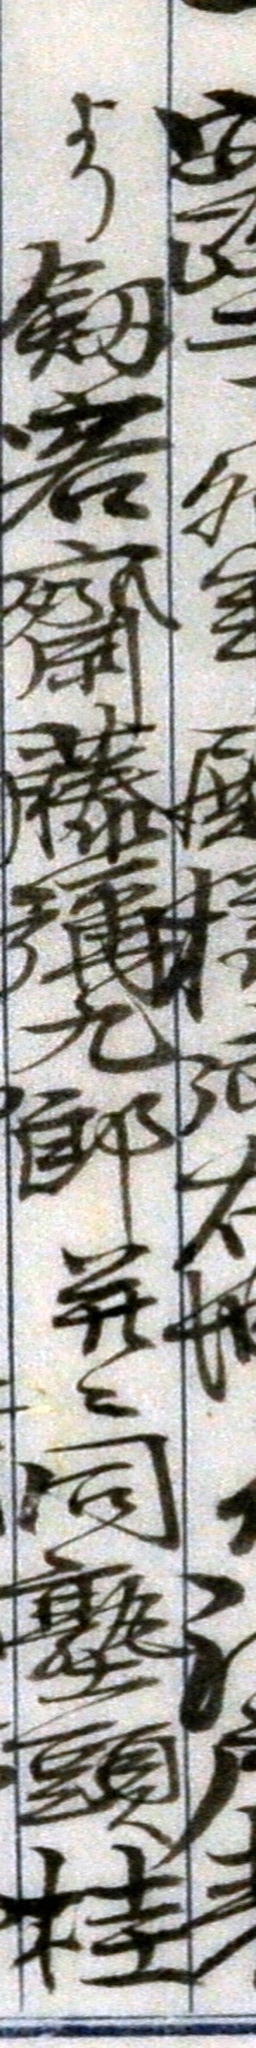より剣客齋藤彌九郎并ニ同塾頭桂
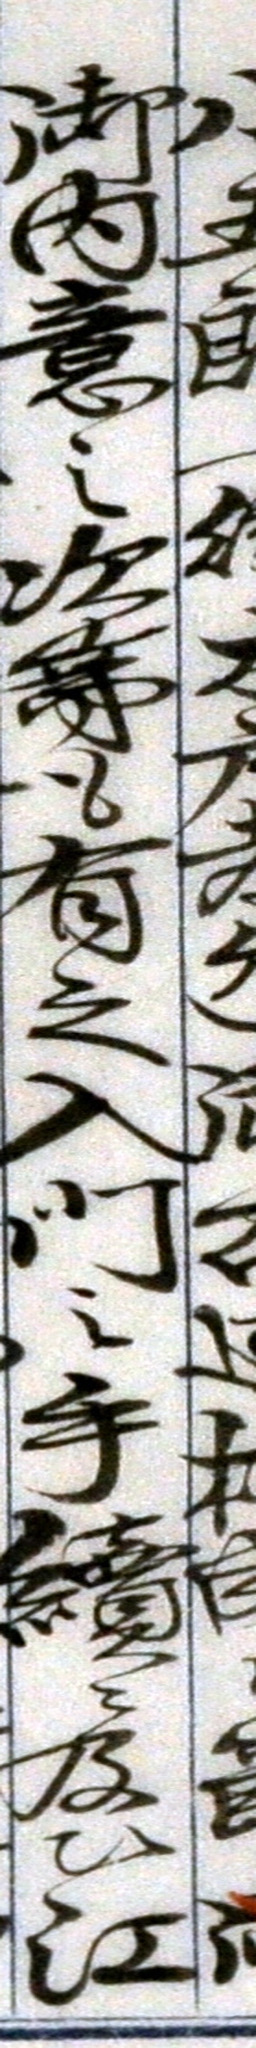御内意之次第も有之入門之手続ニ及ひ江
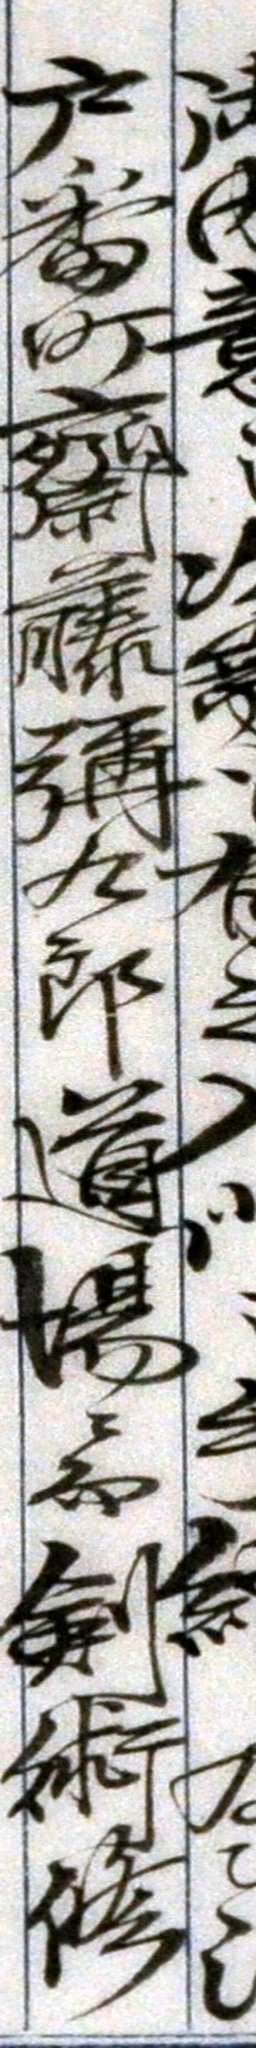戸番町齋藤彌九郎道場ニ而剣術修
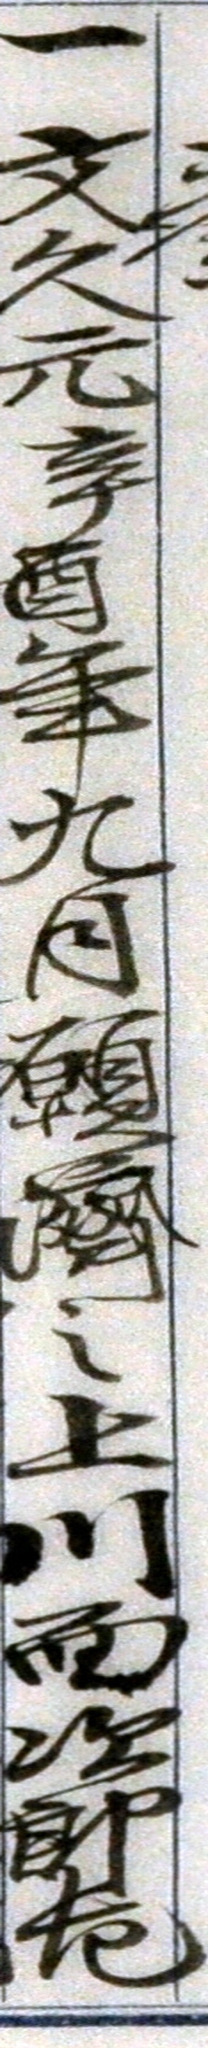一文久元辛酉年九月願済之上川西次郎左

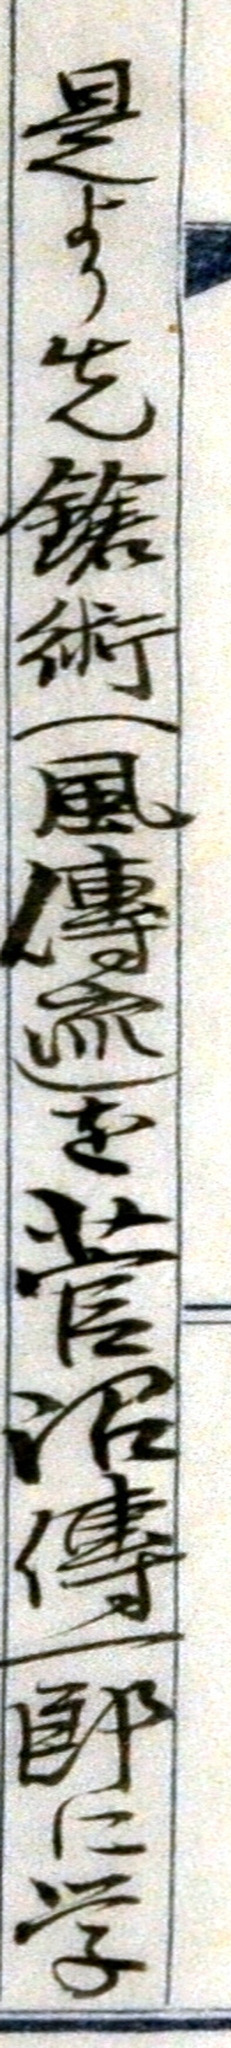是より鎗術(風傳流)を菅沼傳一郎に学
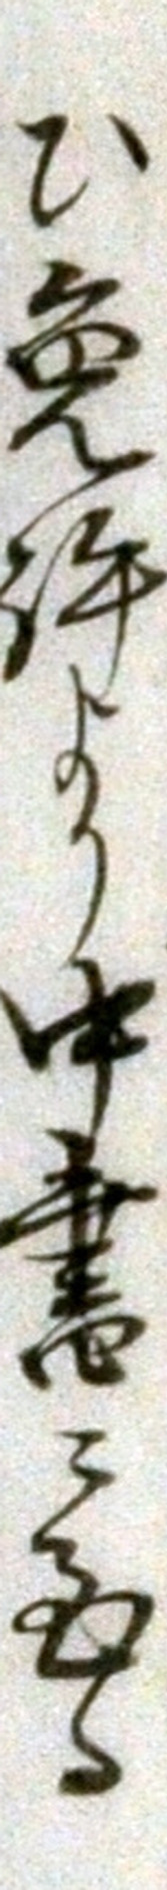ひ免許より中書ニ至る
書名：三好氏先代以来勤仕録、池田丈介一家勤仕録
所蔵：伊那市立高遠町図書館・合同会社AMANE
